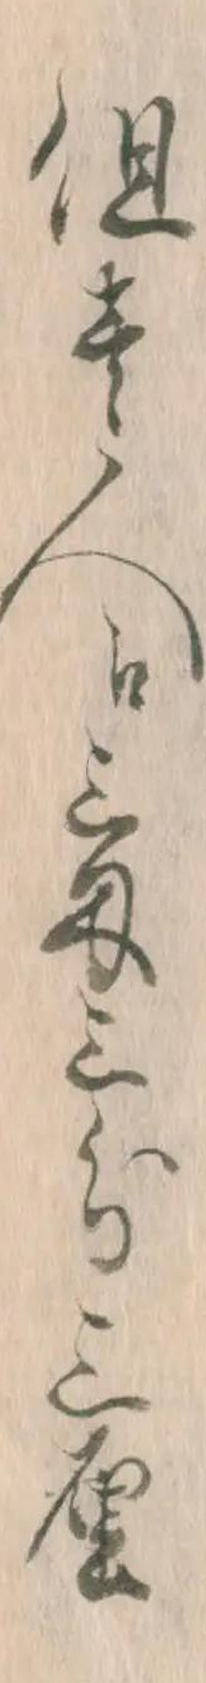但壱人え三匁三分三厘
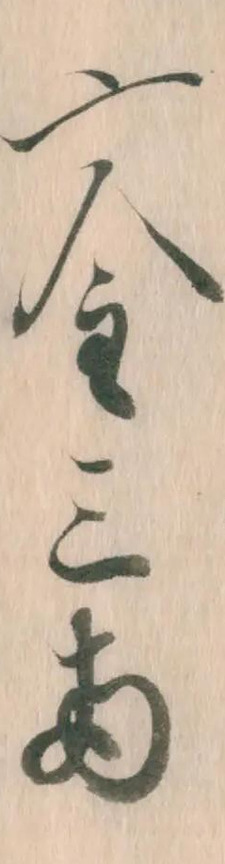〆金三両
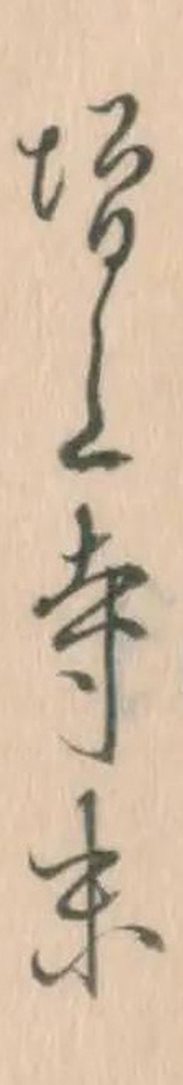増上寺末
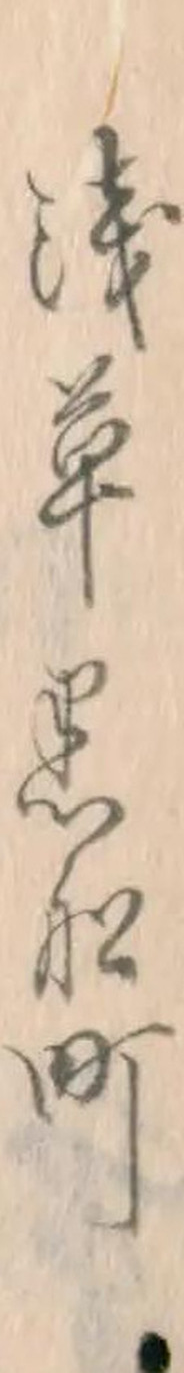浅草黒船町
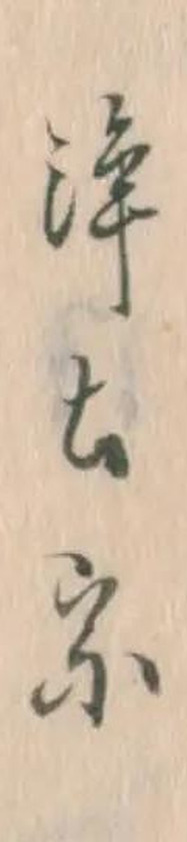浄土宗
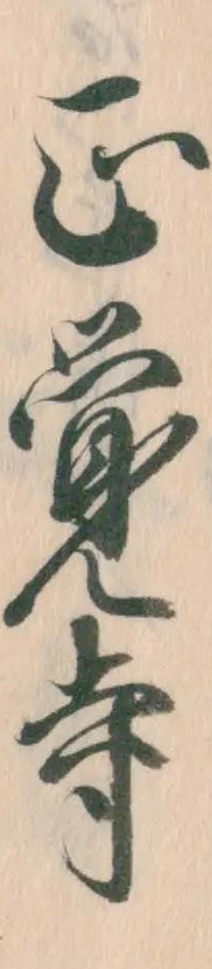正覚寺
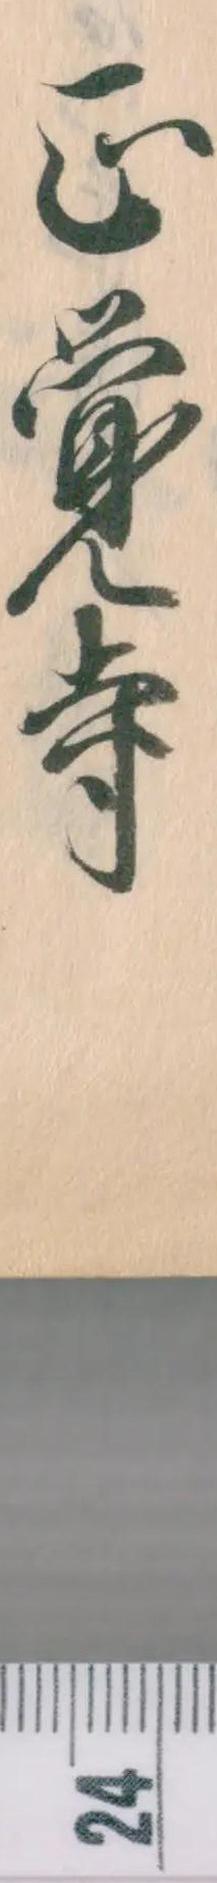正覚寺
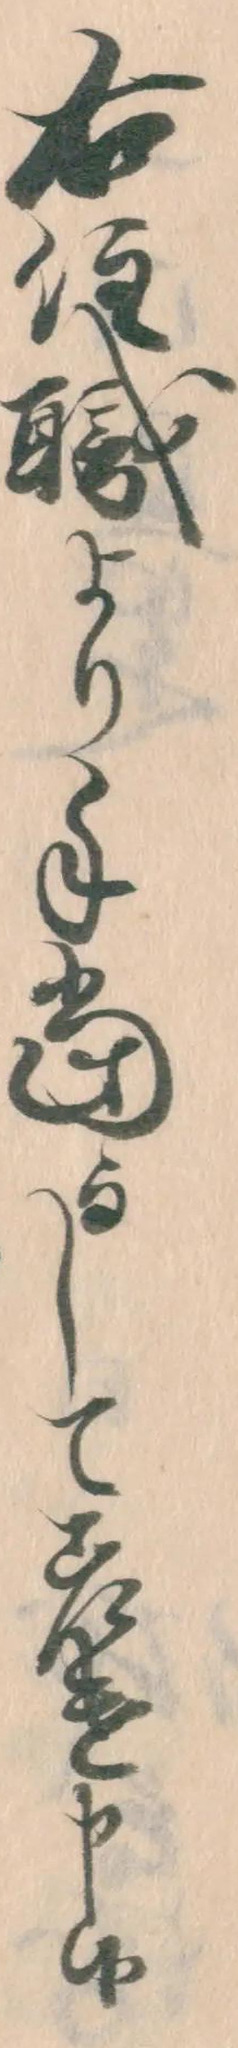右住職より手当として差遣申候

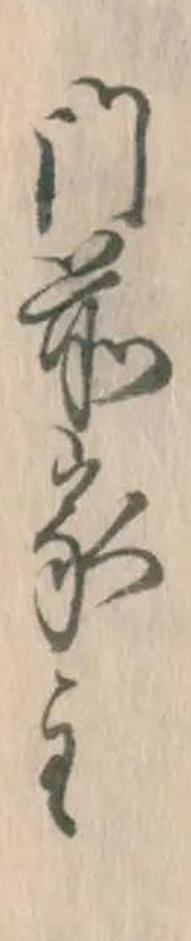門前家主
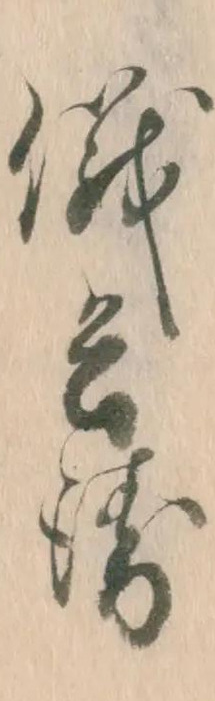重兵衛
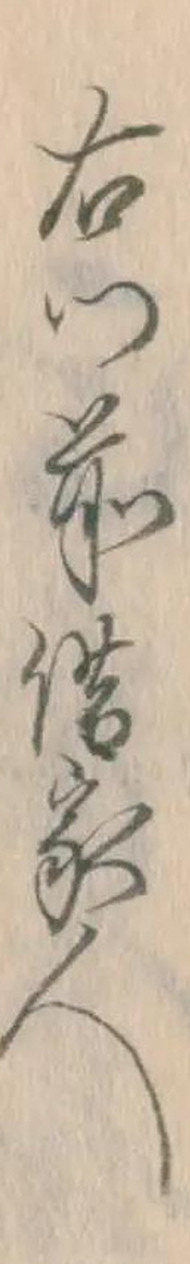右門前借家人
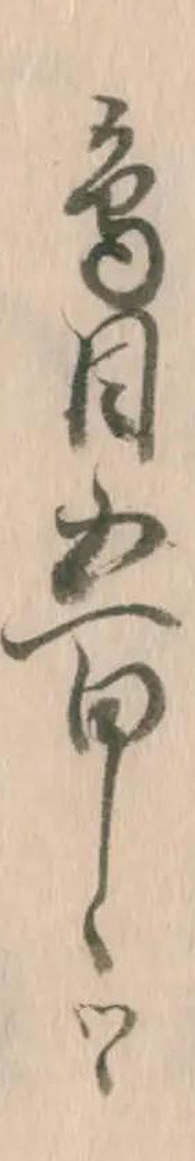鳥目五百文ツヽ同
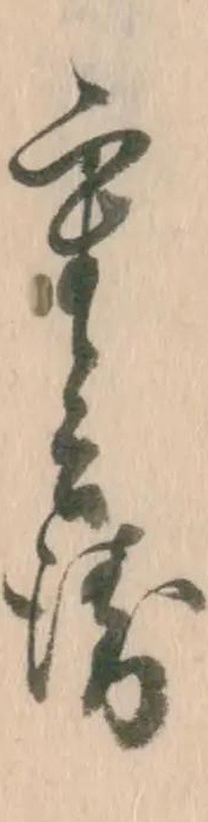重兵衛
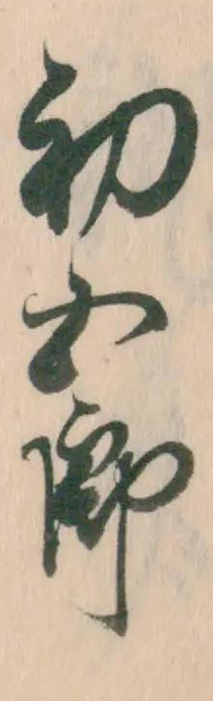初五郎
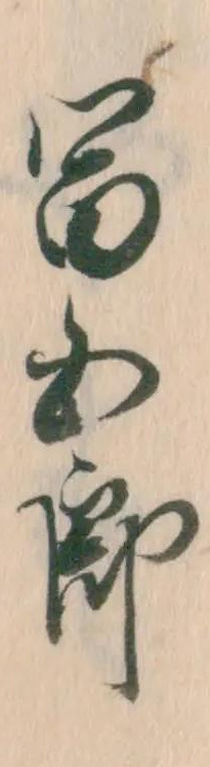初五郎
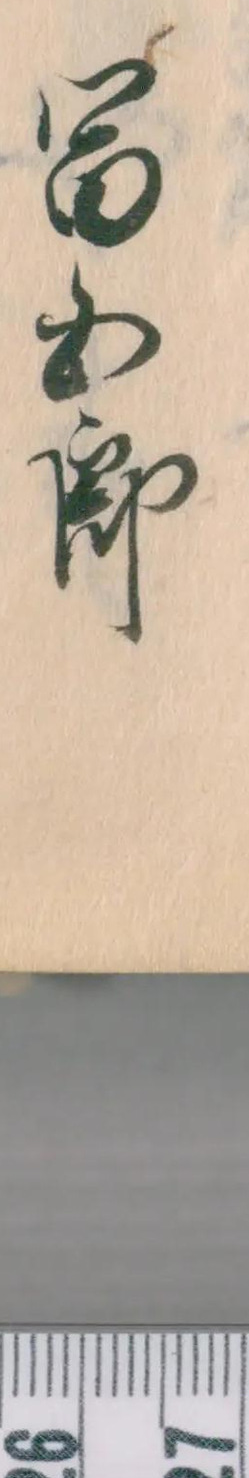冨五郎
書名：武家方并寺院等ニテ施差出候一件
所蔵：国立国会図書館 National Diet Library, JAPAN
